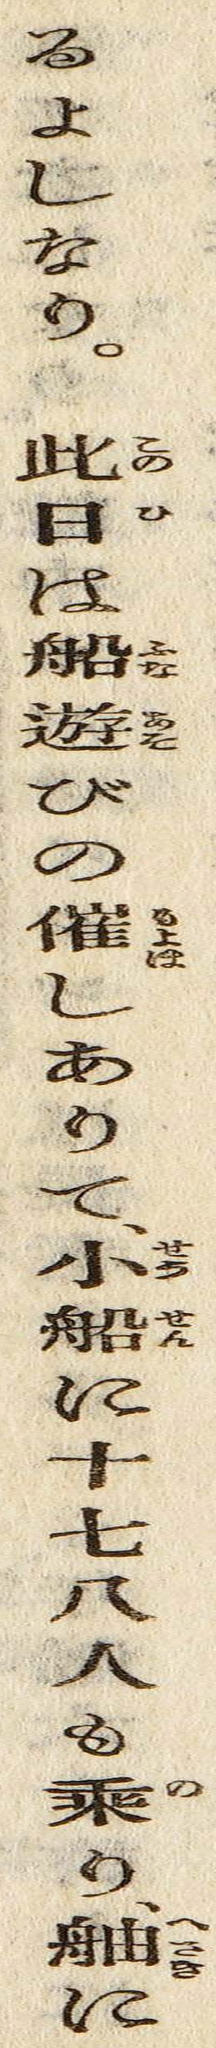るよしなり。此日は船遊びの催しありて、小船に十七八人も乗り、舳に
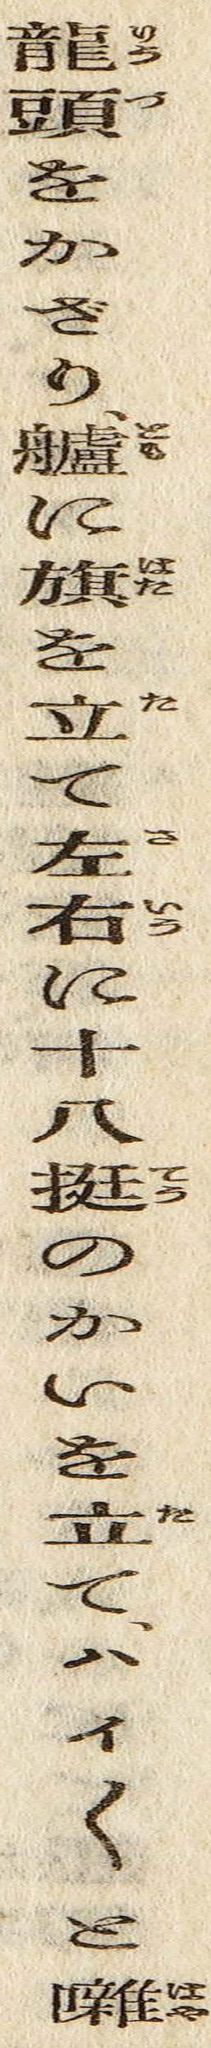竜頭をかざり、艫に旗を立て左右に十八挺のかいを立て、ハイ〳〵と囃
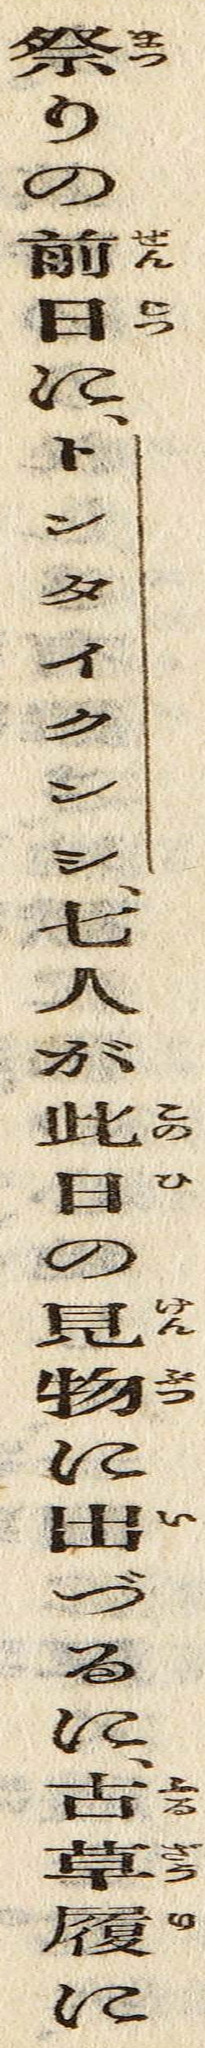祭りの前日に、トンタイクンシ、七人が此日の見物に出づるに、古草履に
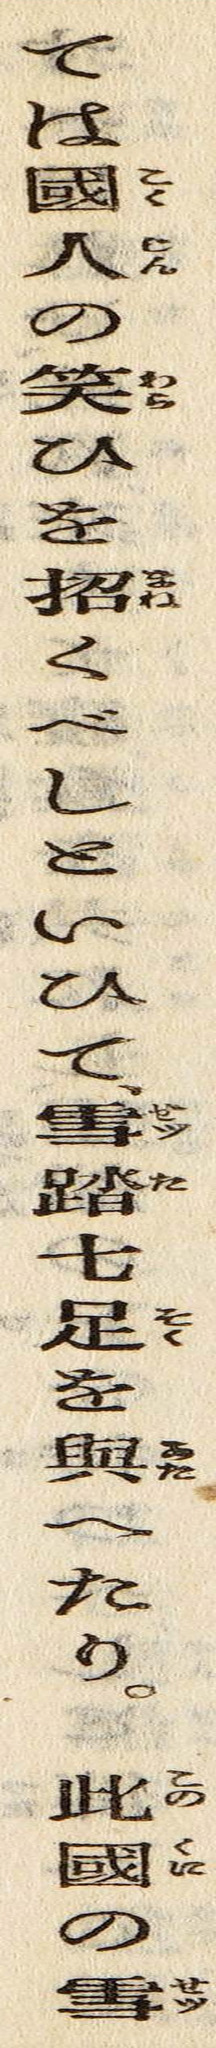ては国人の笑ひを招くべしといひて、雪踏七足を与へたり。此国の雪
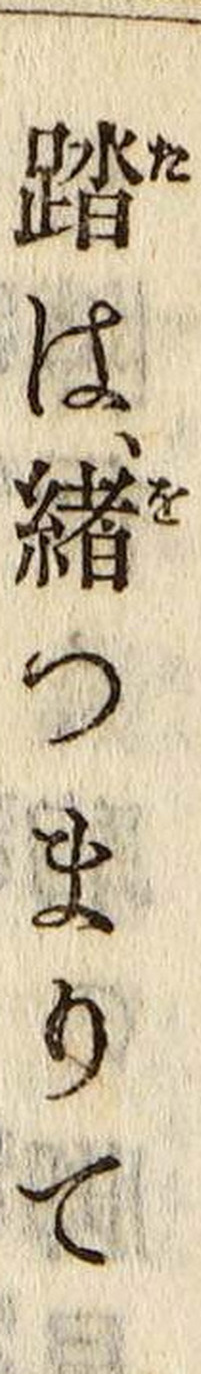踏は、緒つまりて
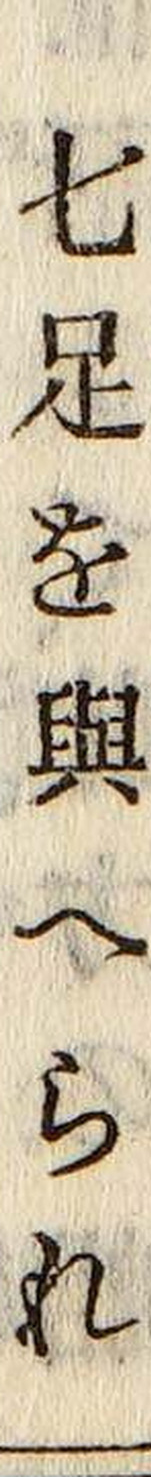七足を与へられ
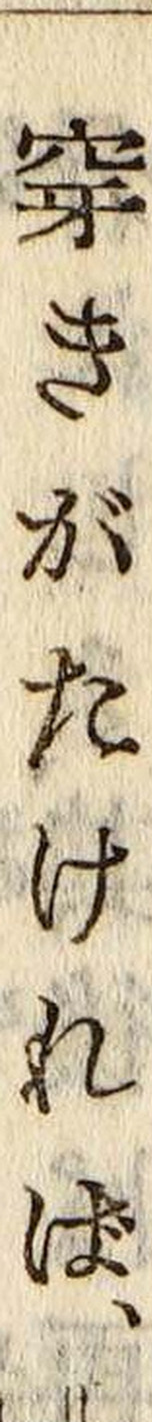穿きがたければ、
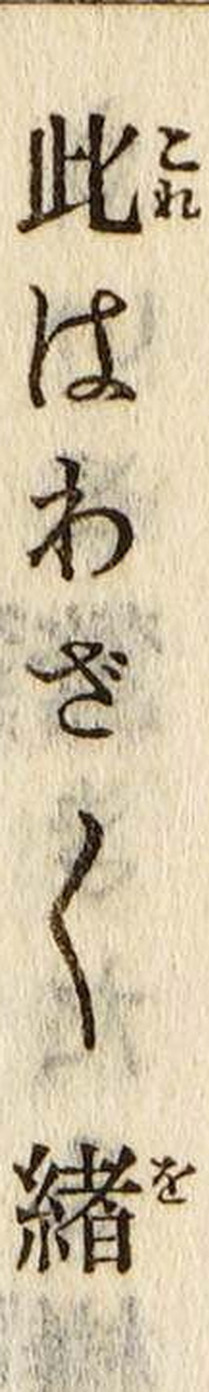此はわざ〳〵緒
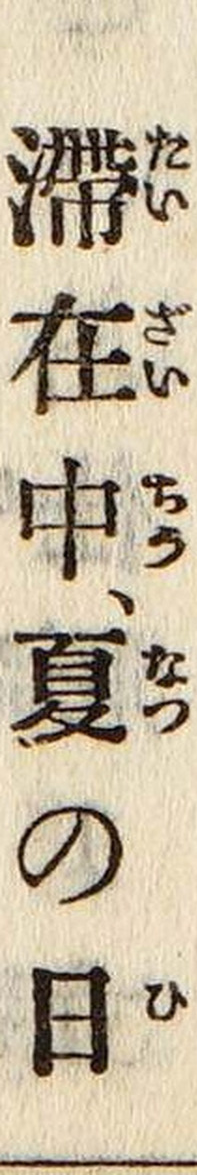滞在中、夏の日
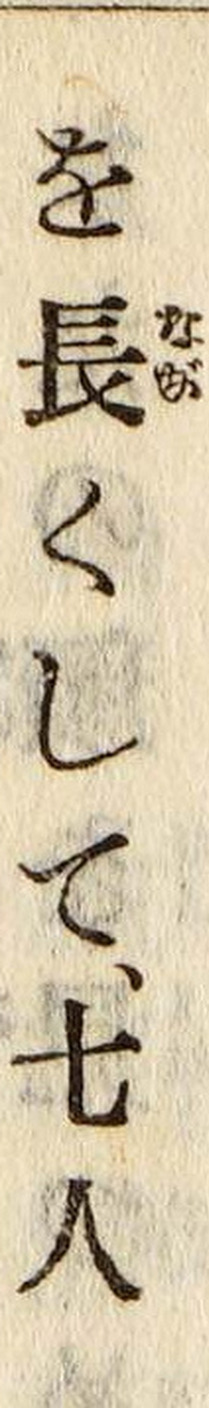を長くして、七人
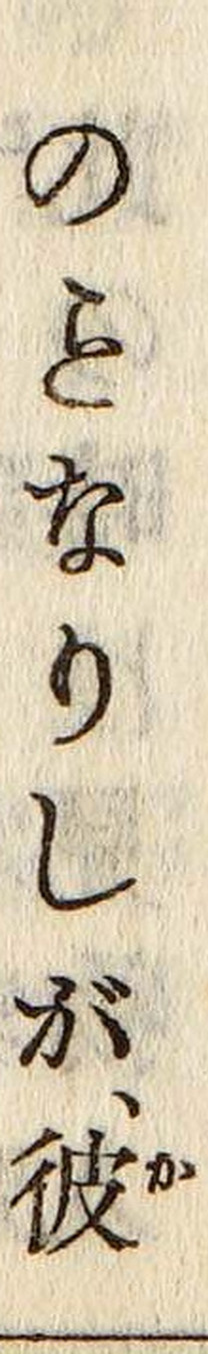のことなりしが、彼
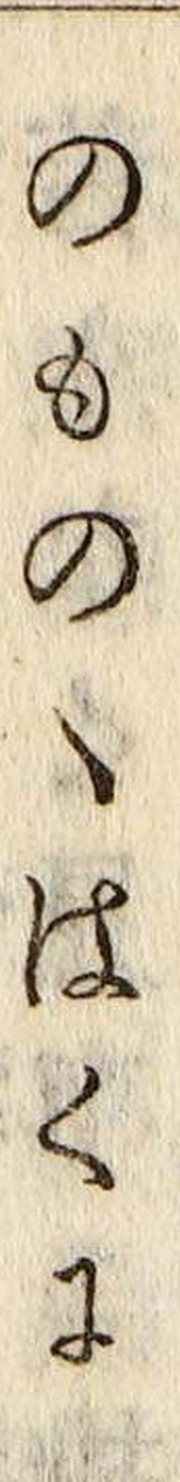のものヽはくに
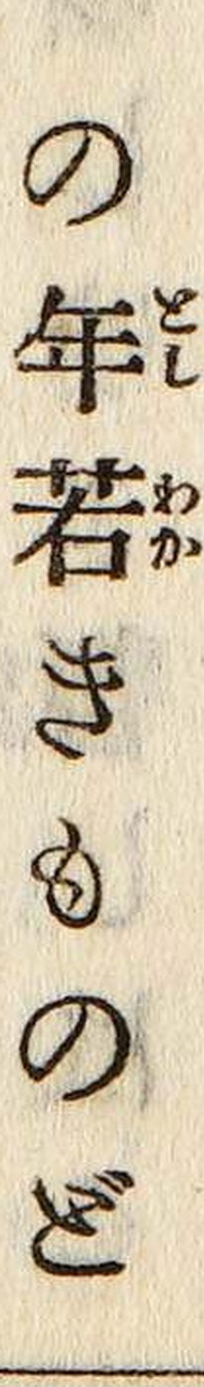の年若きものど
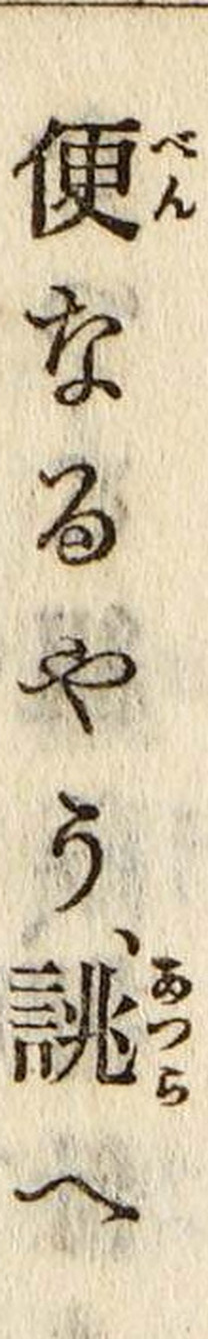便なるやう、誂へ
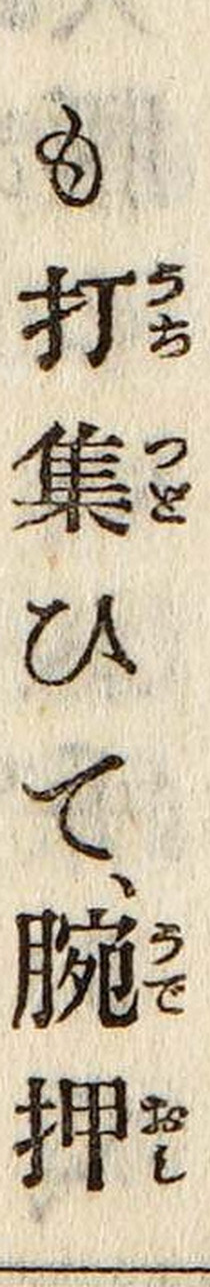も打集ひて、腕押
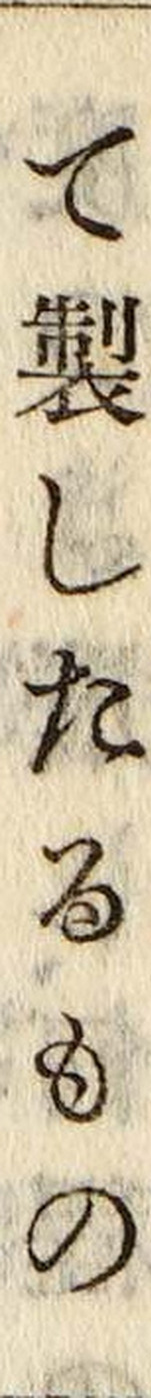て製したるもの
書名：日本漂流譚
